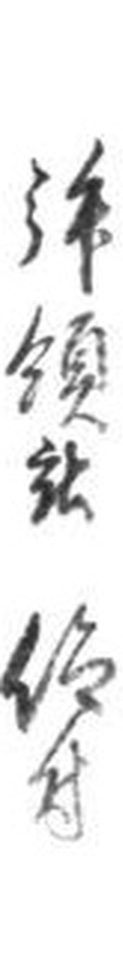拝領被仰付
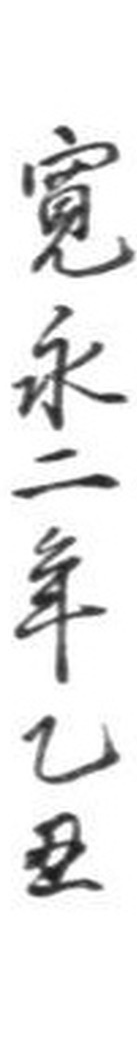寛永二年乙丑
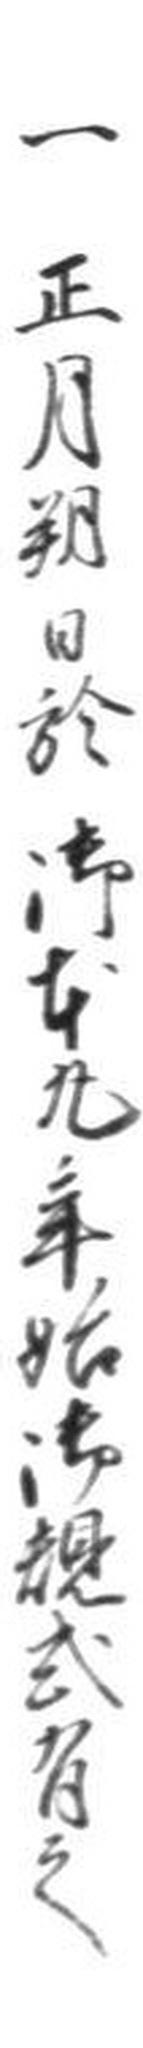一正月朔日於御本丸年始御規式有之
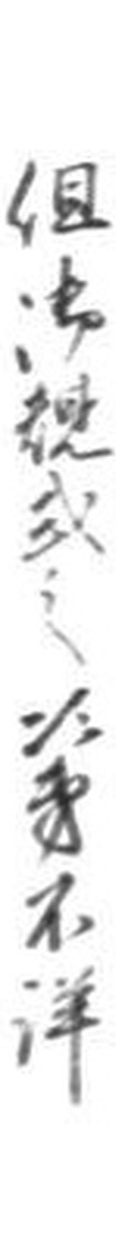但御規式之次第不詳
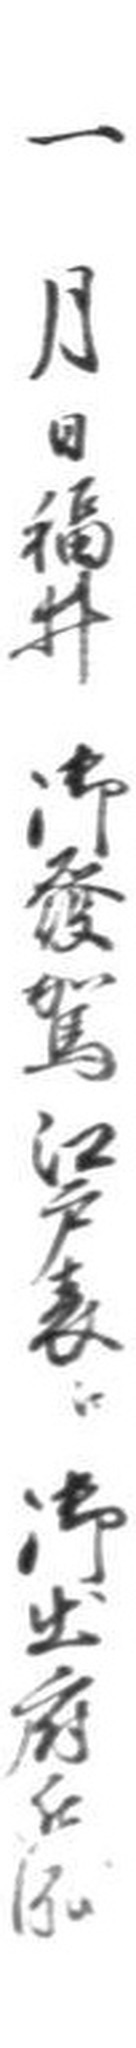一月日福井御発駕江戸表江御出府被成
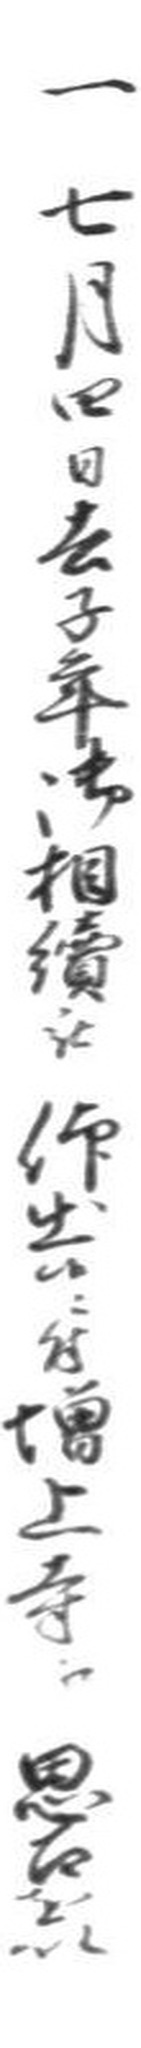一七月四日去子年御相続被仰出候ニ付増上寺江思召を以
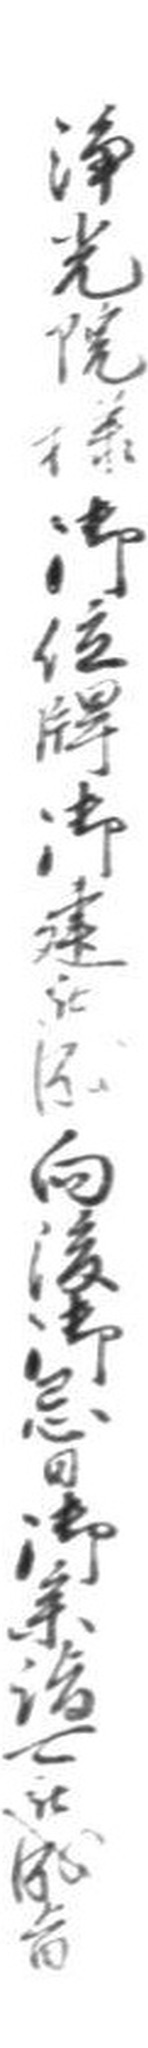浄光院様御位牌御建被成向後御忌日御参詣可被成旨
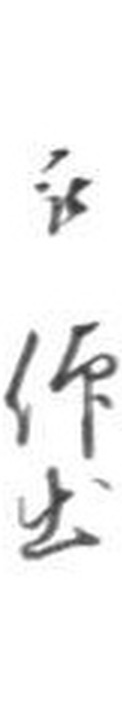被仰出

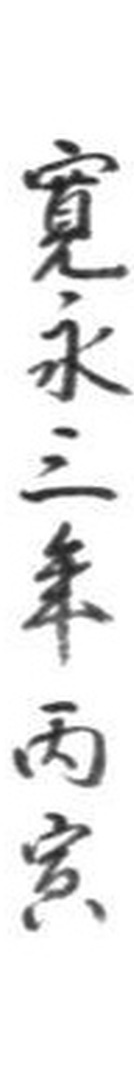寛永三年丙寅
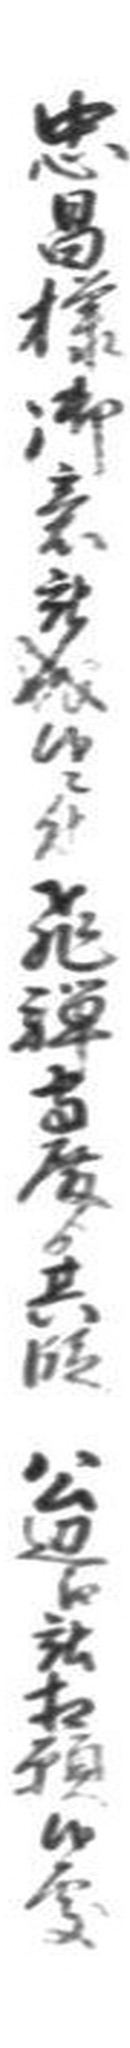忠昌様御意被成候ニ付飛騨守殿ゟ其段公辺江被相願候処
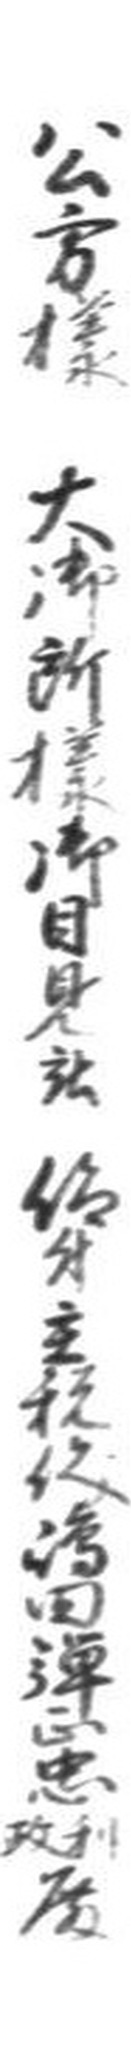公方様大御所様御目見被仰付主税儀嶋田弾正忠利政殿
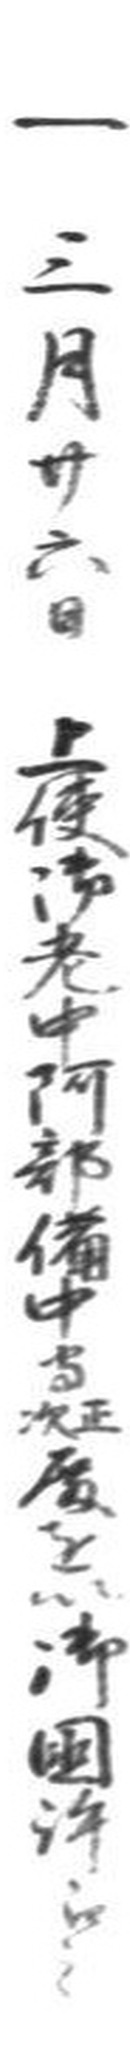一三月廿六日上使御老中阿部備中守正次殿を以御国許江之

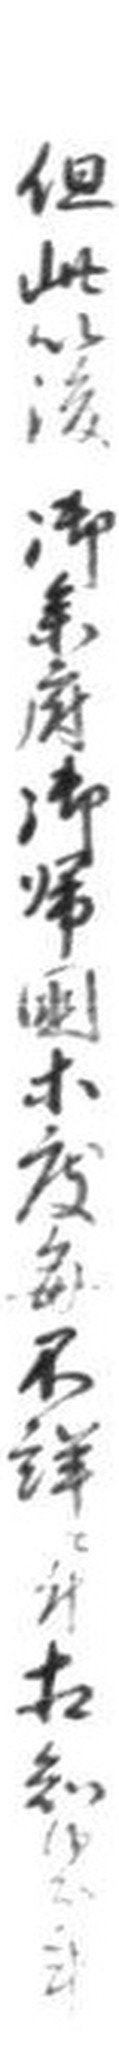但此以後御参府御帰国等度毎不詳ニ付相知候分斗
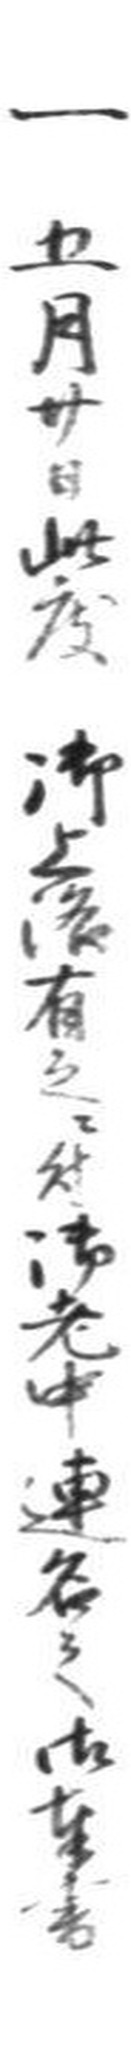一五月廿日此度御上洛有之ニ付御老中連名之御奉書
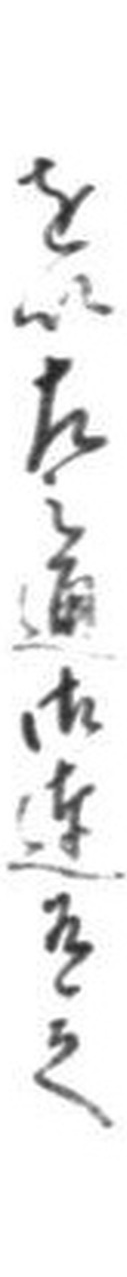を以左之通御達有之
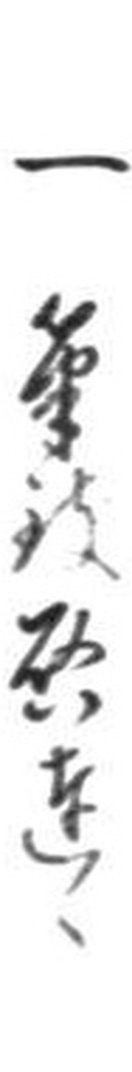一筆致啓達候
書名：家譜 三 忠昌公 従慶長八年到寛永六年
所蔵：福井県文書館 Fukui Prefectural Archives
